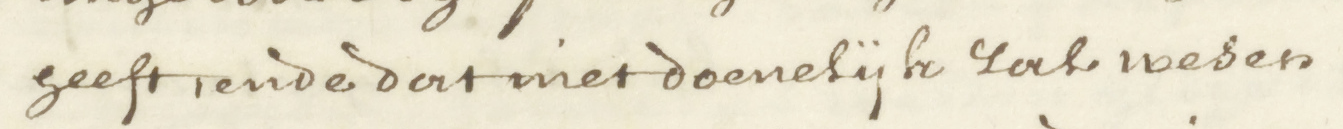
heeft ende dat niet doenelijk zal wesen
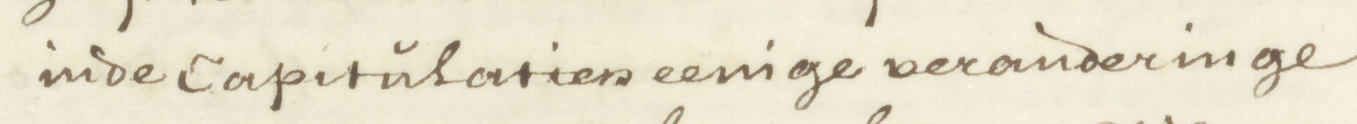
inde capitulatien eenige veranderinge
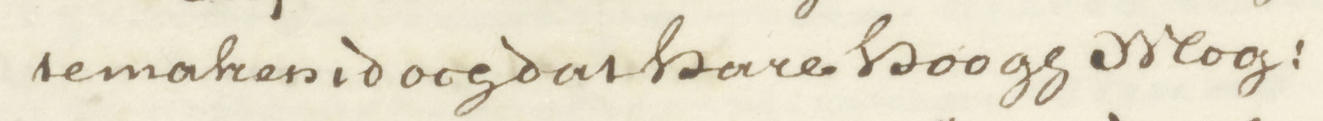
te maken, doch dat hare Hoogh Mog:
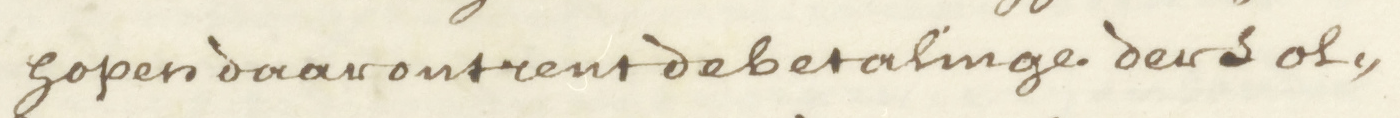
hopen daarontrent de betalinge der sol„
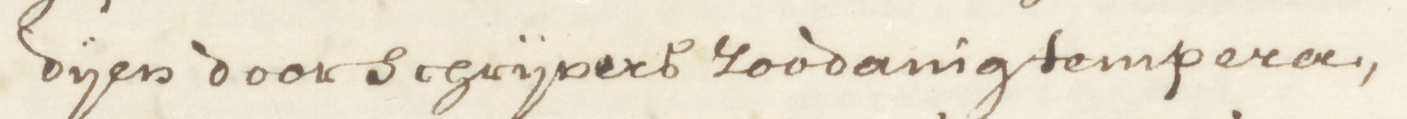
dijen door schrijvers zoodanig tempera„
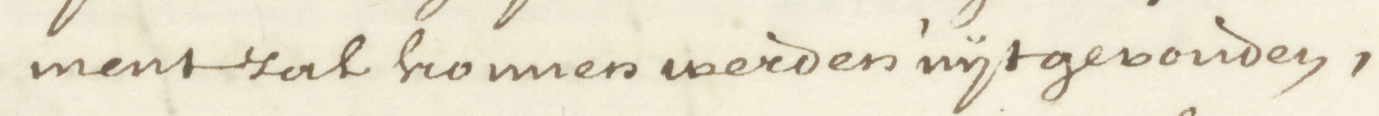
ment zal konnen werden uijtgevonden,
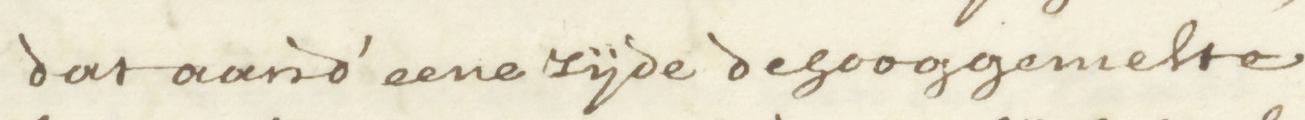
dat aand'eene zijde de hooggemelte
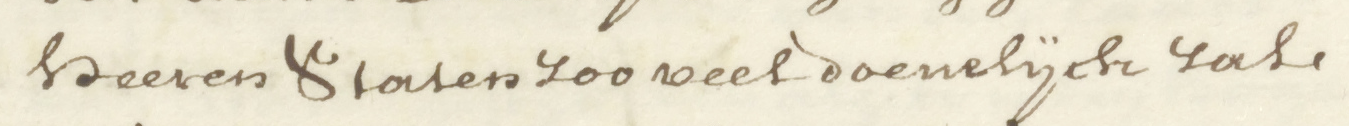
heeren Staten zoo veel doenelijck zal
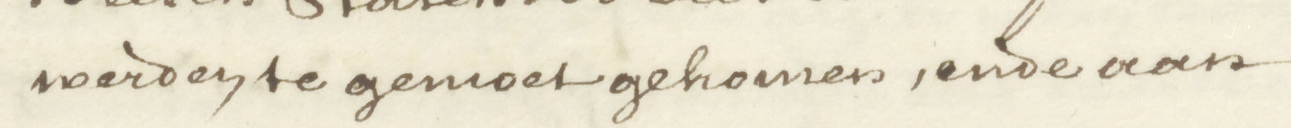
werden te gemoet gekomen, ende aan
